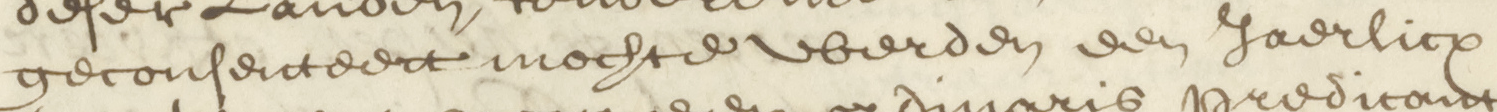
geconsenteert mochte werden een Jaerlicx
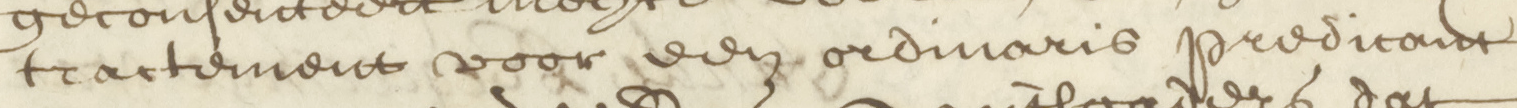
tractement voor een ordinaris predicant
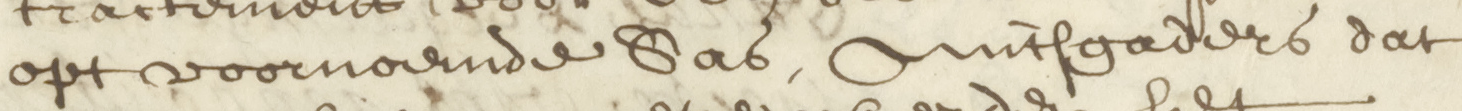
opt voornoemde Sas, Mitsgaders dat
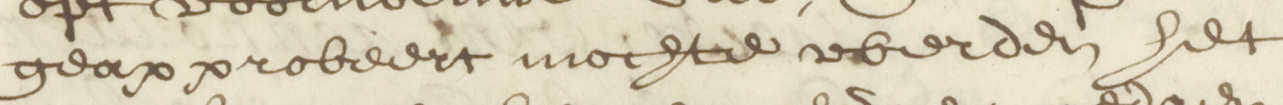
geapprobeert mochte werden het
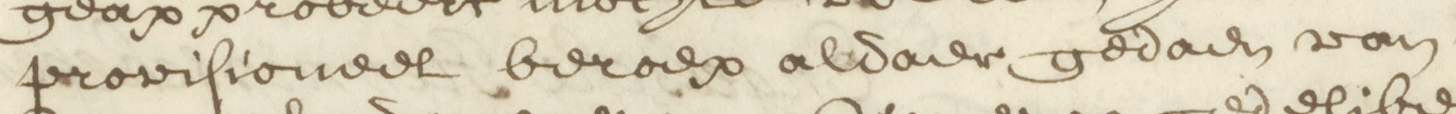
provisioneel beroep aldaer gedaen van
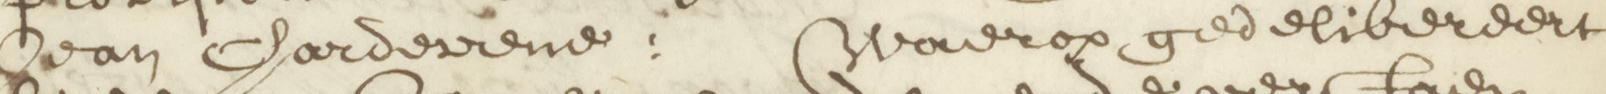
Jean Chardevene: Waerop gedelibereert
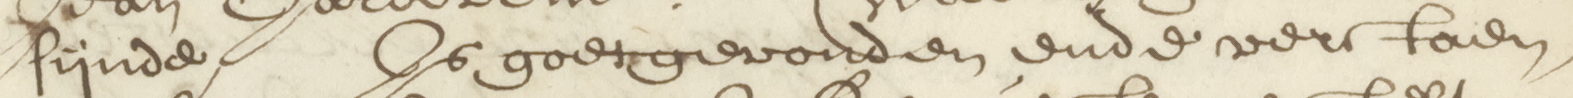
sijnde, Is goetgevonden ende verstaen,
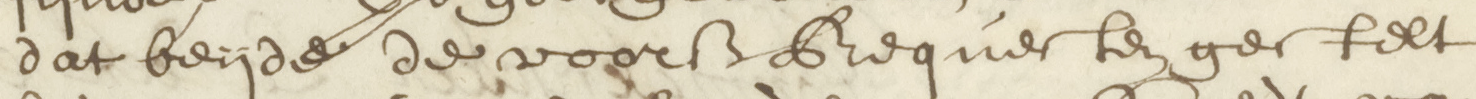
dat beijde de voorss. Requesten gestelt
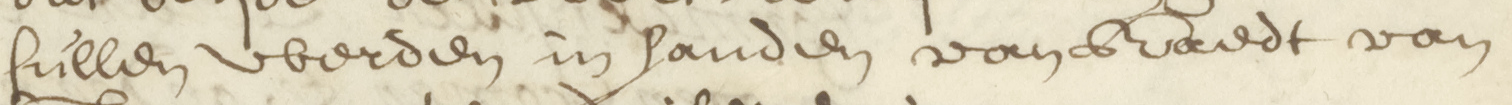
sullen werden in handen van Raedt van
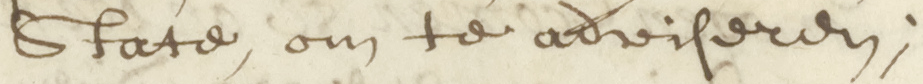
State, om te adviseren;
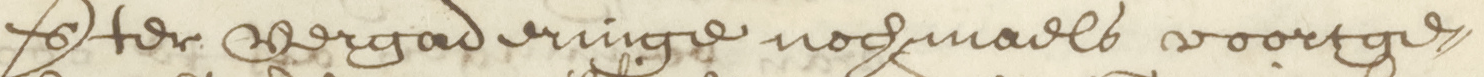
Is ter vergaderinge nochmaels voortge„
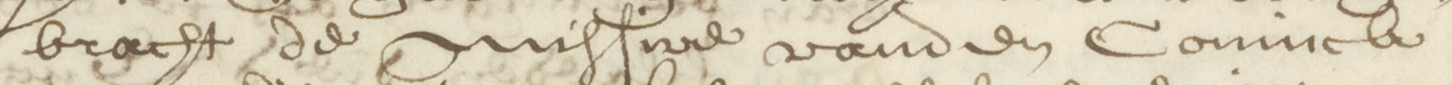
bracht de Missive vanden Coninck
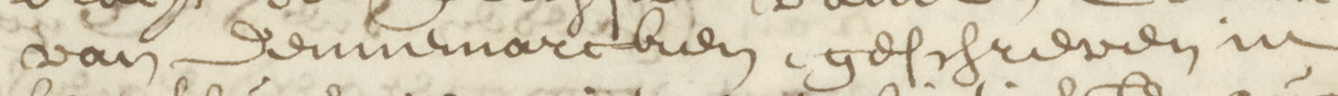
van Dennemarcken, geschreven in
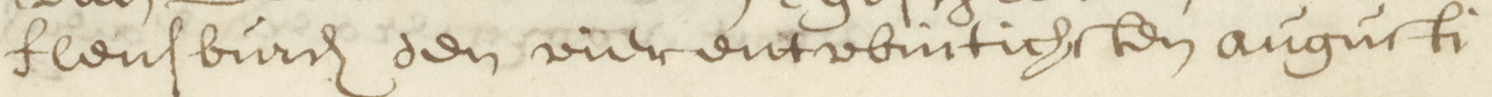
Flensburch den vierentwintichsten augusti
